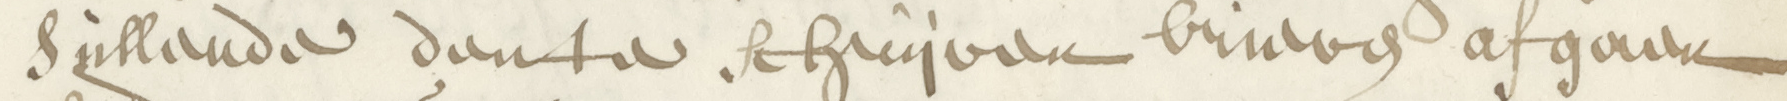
sullende den te schrijven brieven afgaen
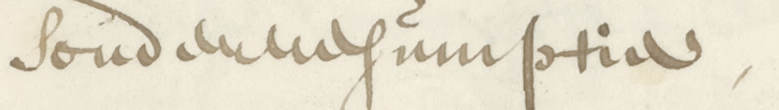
sonder resumptie.
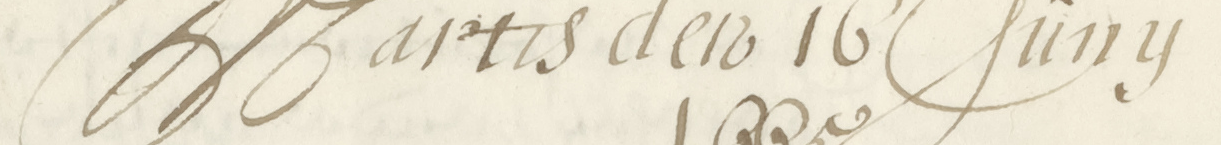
Martis den 16 Junij
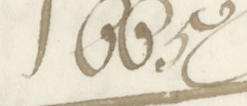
1665
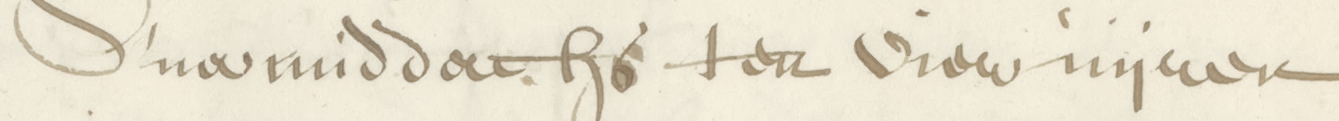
S‛na middachs ten Vier uijren
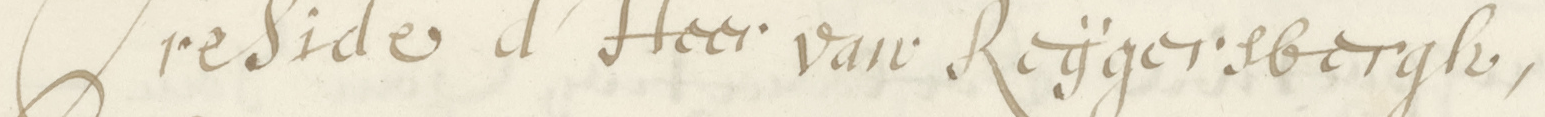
Preside d'Heer van Reijgersbergh,
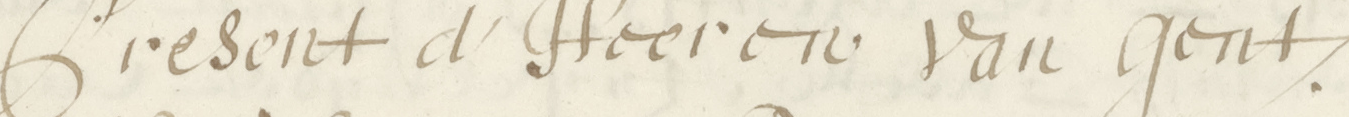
Present d'Heeren van Gent,
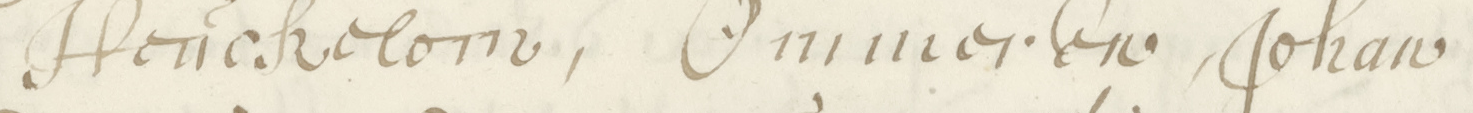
Heuckelom, Ommeren, Johan
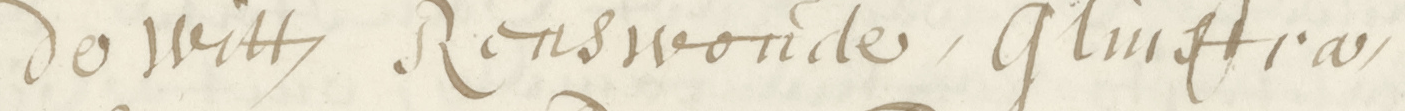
de Witt, Renswoude, Glinstra,
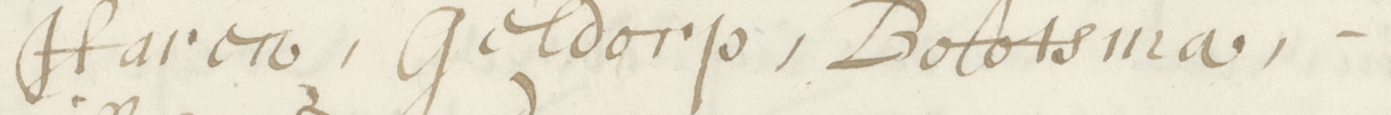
Haren, Geldorp, Bootsma, -
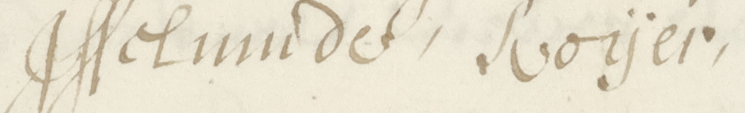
Isselmude, Roijer,
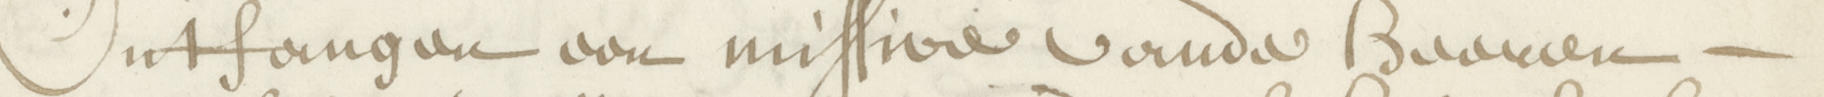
Ontfangen een missive vande Heeren
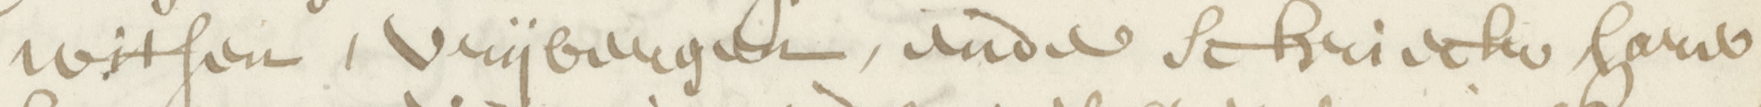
witsen, Vrijbergen, ende Schrieck hare
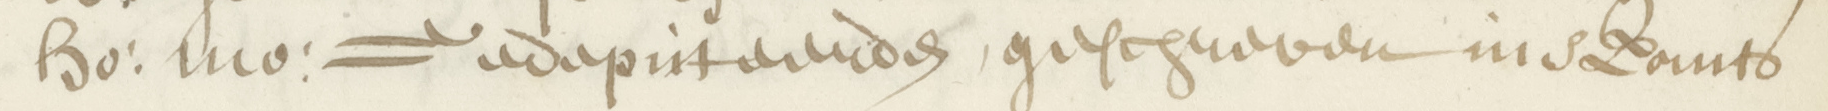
Ho:Mo: Gedeputeerden, geschreven in sLants
